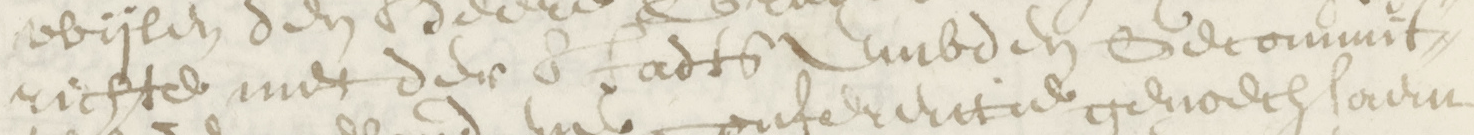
richte met der Stadts Embden Gecommit„
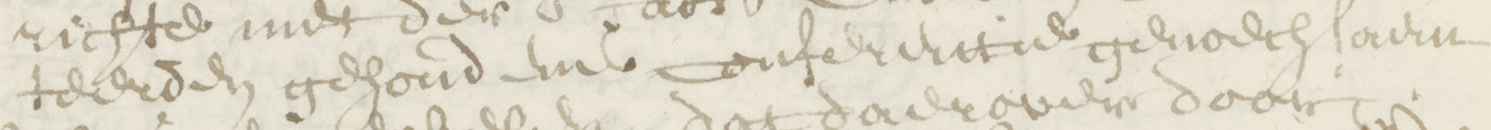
teerden gehoudene conferentie genoechsaem
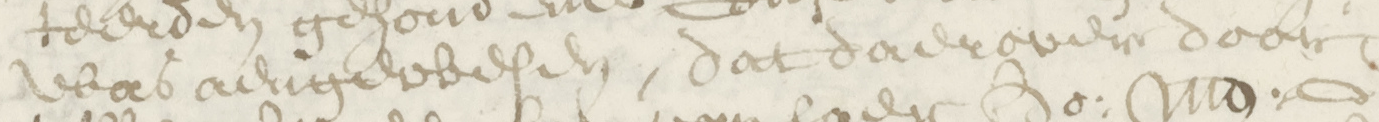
was aengewesen, dat daerover door
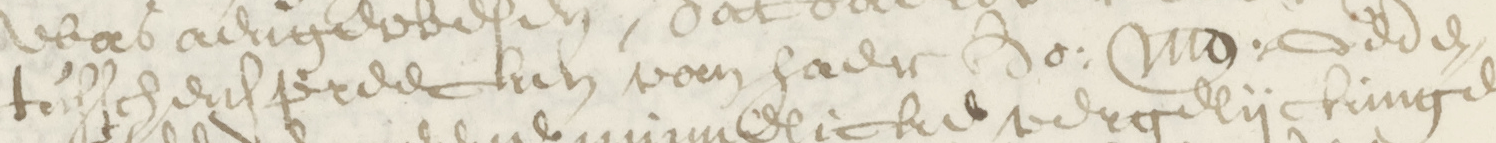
tusschen spreecken van haer Ho:Mo: Gede„
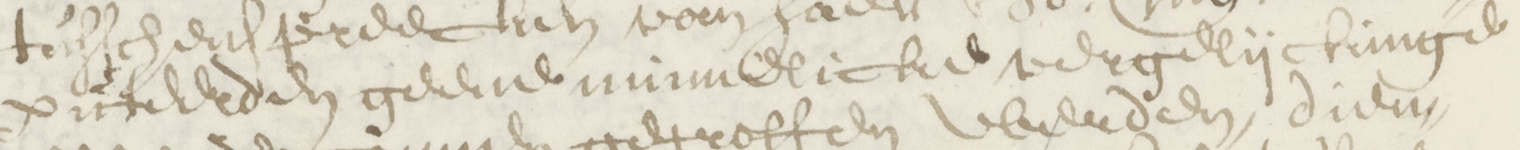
puteerden geene minnelicke vergelijckinge
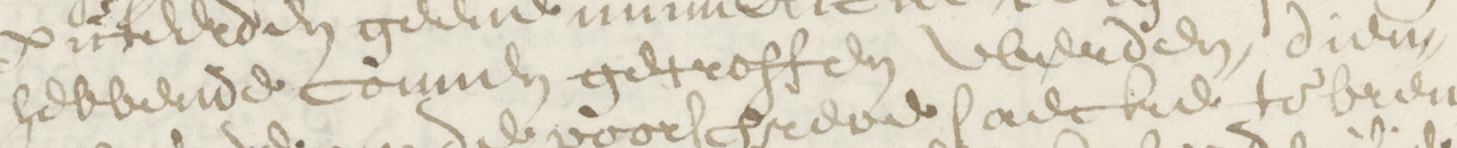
hebbende connen getroffen werden, dien„
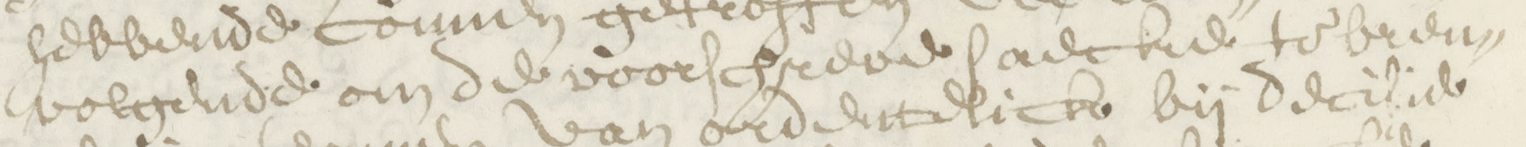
volgende om de voorschreve saecke te bren„
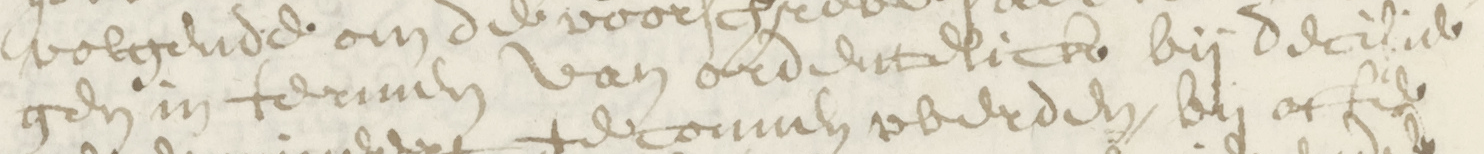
gen in termen van ordentlick bij decisie
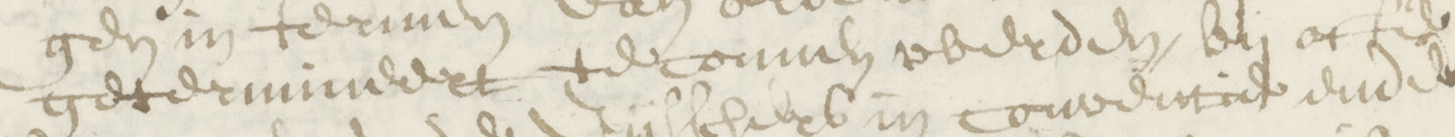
getermineert te connen werden, bij ofte
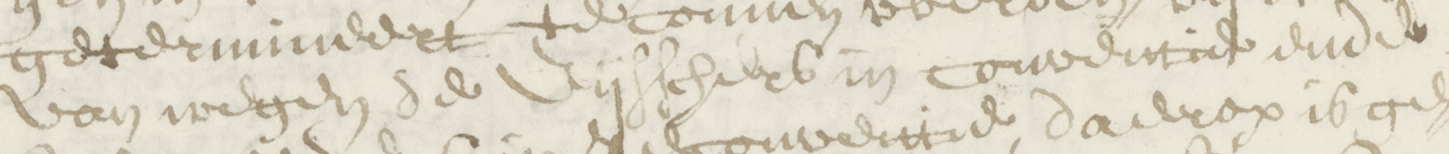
van wegen de Eijsschers in conventie ende
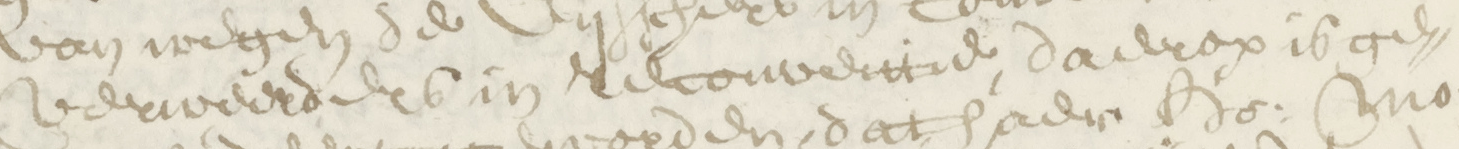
verweerders in reconventie, daerop is ge„
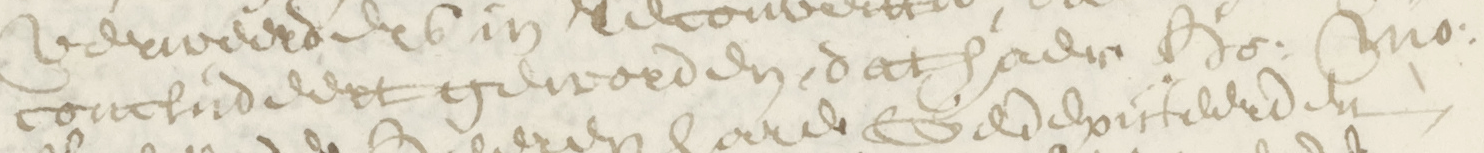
concludeert geworden, dat haer Ho:Mo:
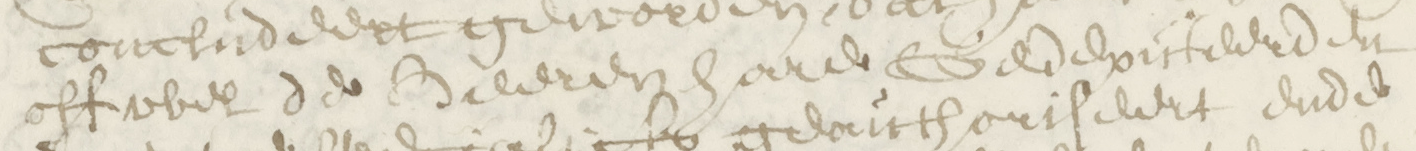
offwel de Heeren hare Gedeputeerden,
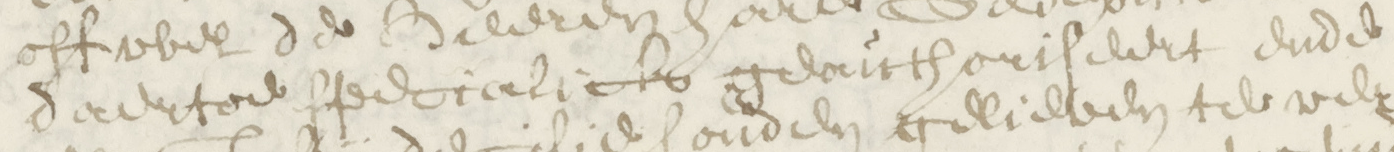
daertoe specialicks geauthoriseert ende
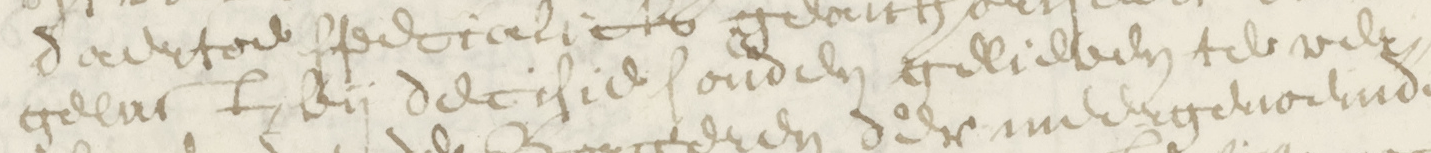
gelast, bij decisie souden gelieven te ver„
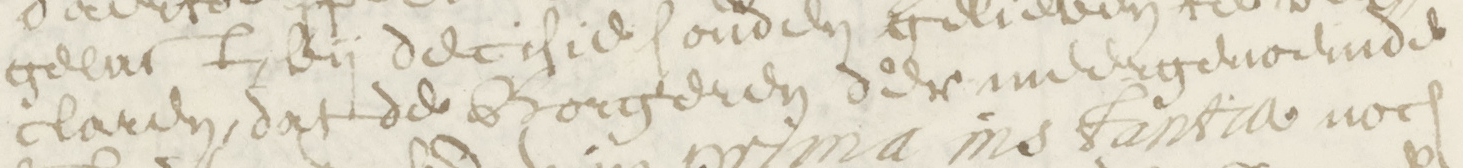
claren, dat de Borgeren der meergenoemde
